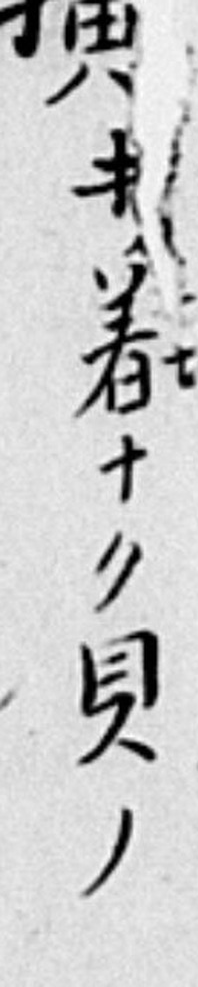打着ナク貝ノ
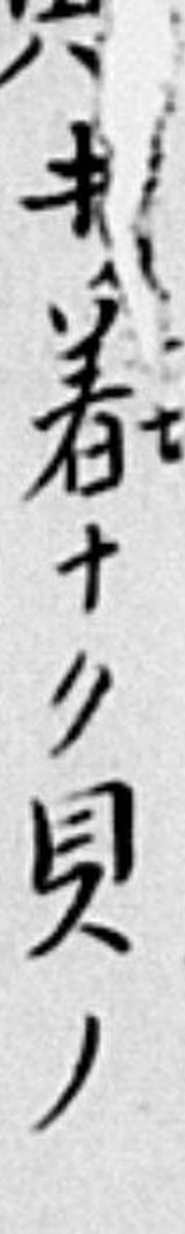打着ナク貝ノ
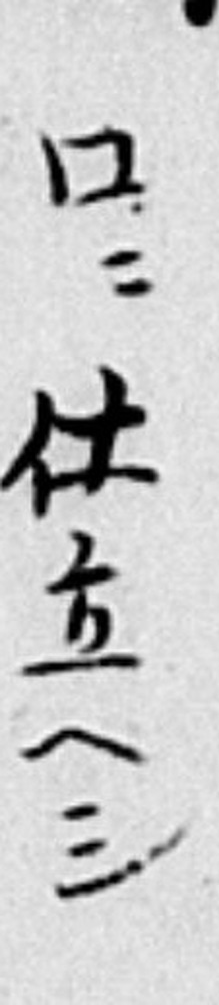口ニ仕立ヘシ

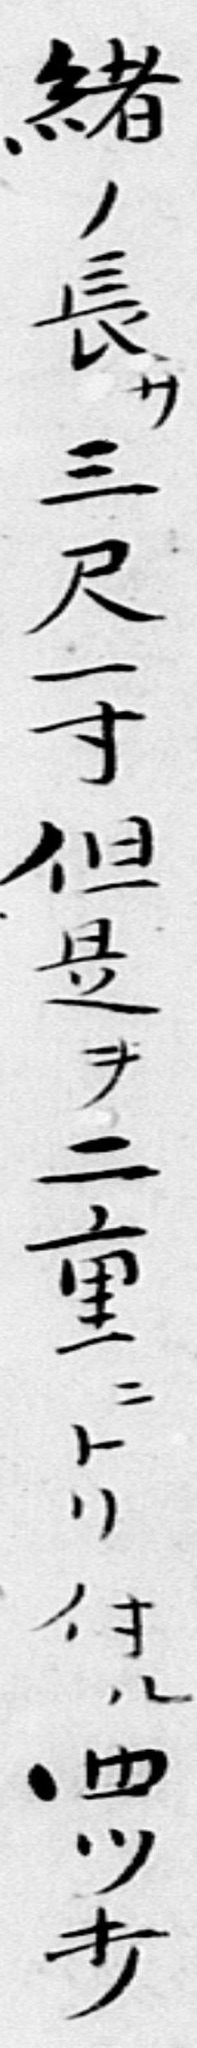緒ノ長サ三尺一寸但是ヲ二重ニトリ付ル四ツ打
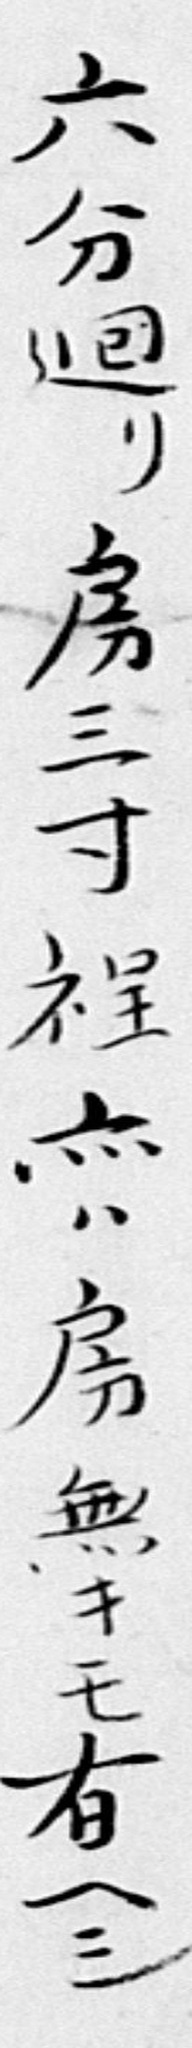六分廻リ房三寸程亦ハ房無キモ有ヘシ
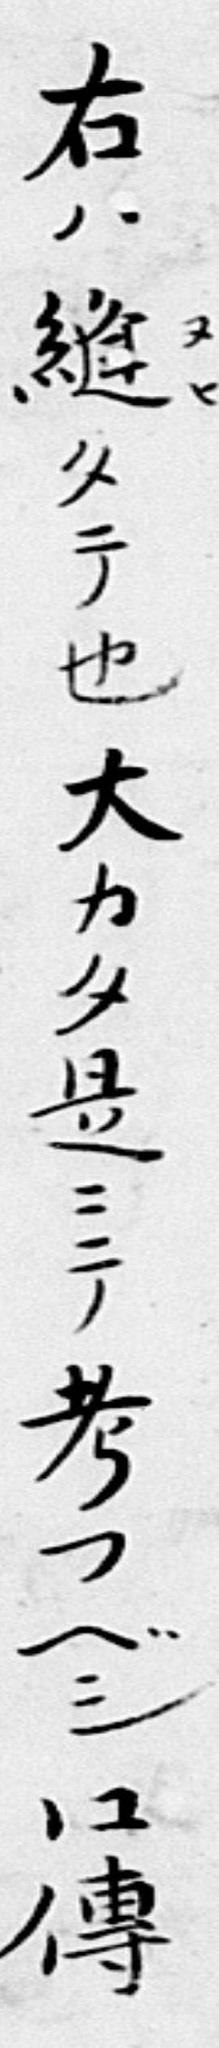右ハ縫タテ也大カタ是ニテ考フヘシ口伝
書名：天児之書（あまがつのしょ）
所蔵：徳島県立図書館
